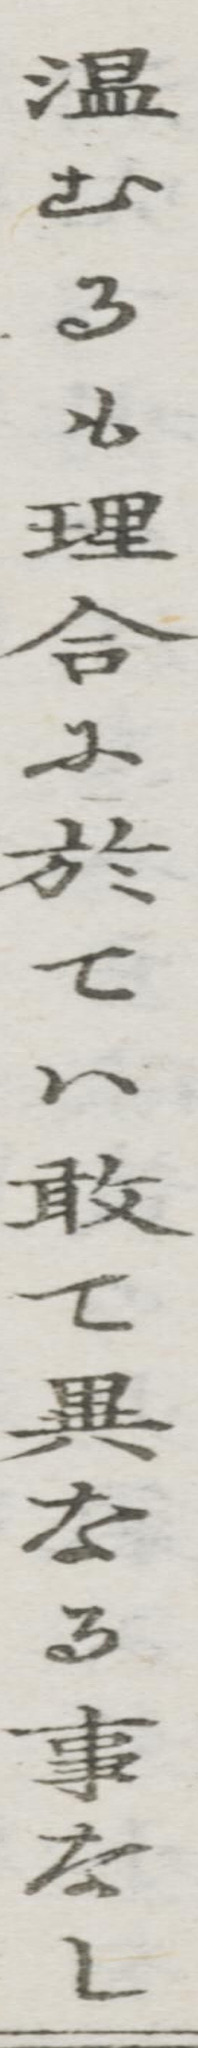温むるも理合に於ては敢て異なる事なし
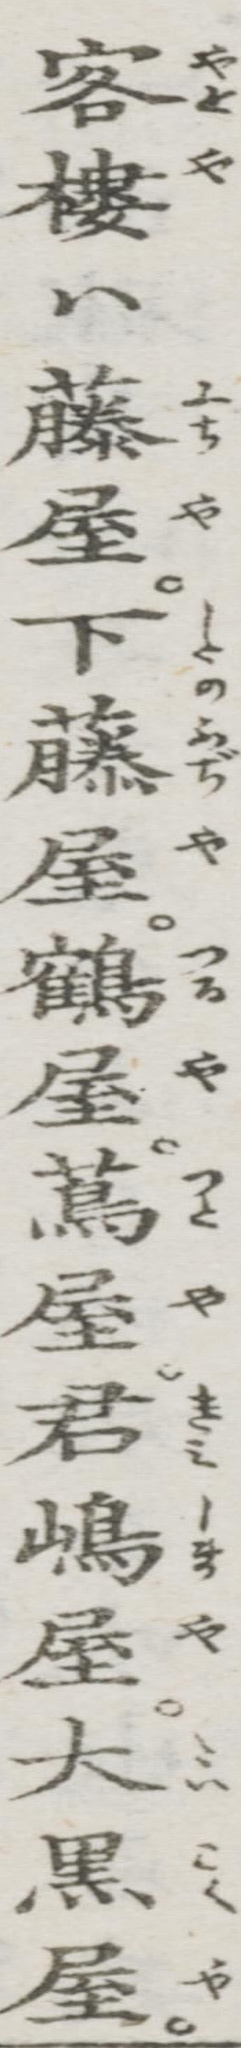客樓は藤屋。下藤屋。鶴屋。蔦屋。君嶋屋。大黒屋。
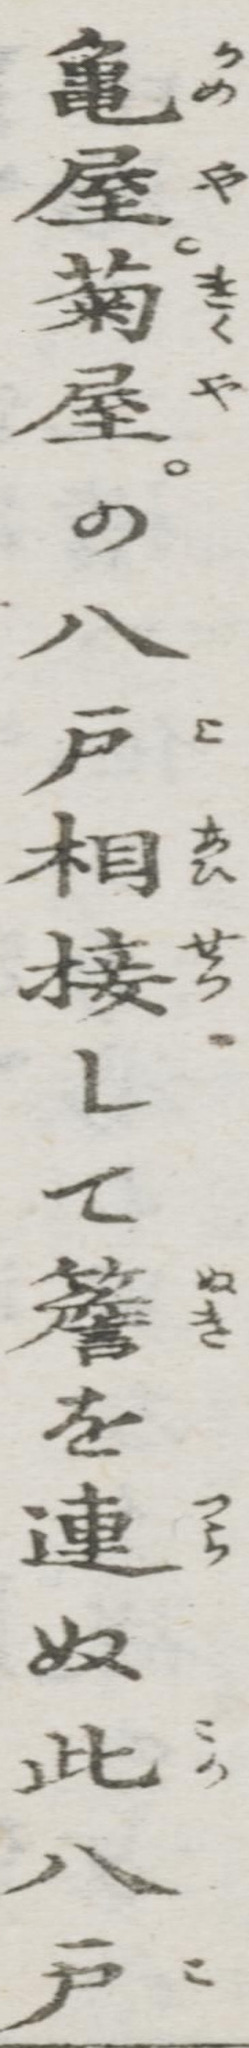亀屋。菊屋。の八戸相接して簷を連ね此八戸
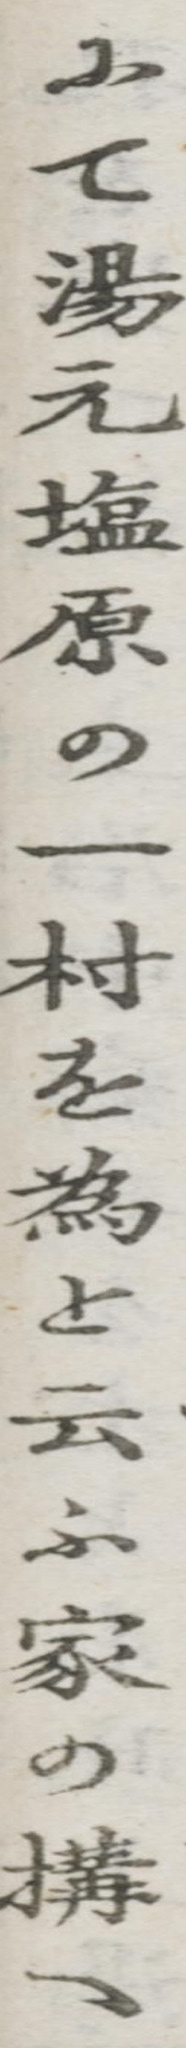にて湯元塩原の一村を為と云ふ家の構へ
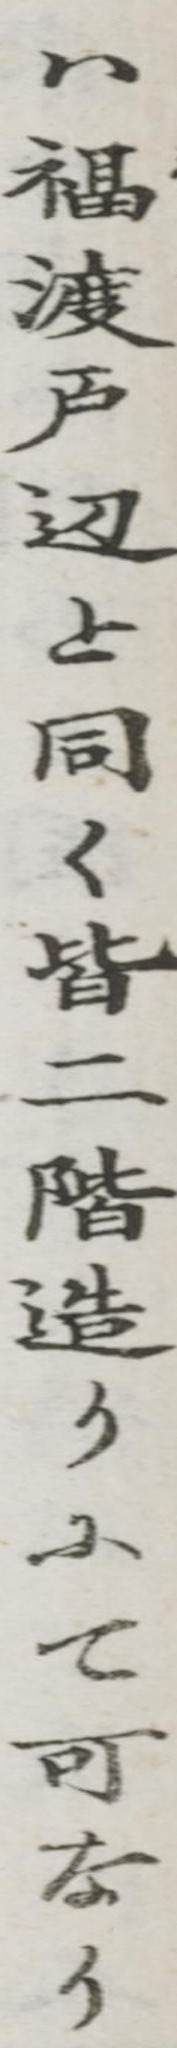は福渡戸辺と同く皆二階造りにて可なり
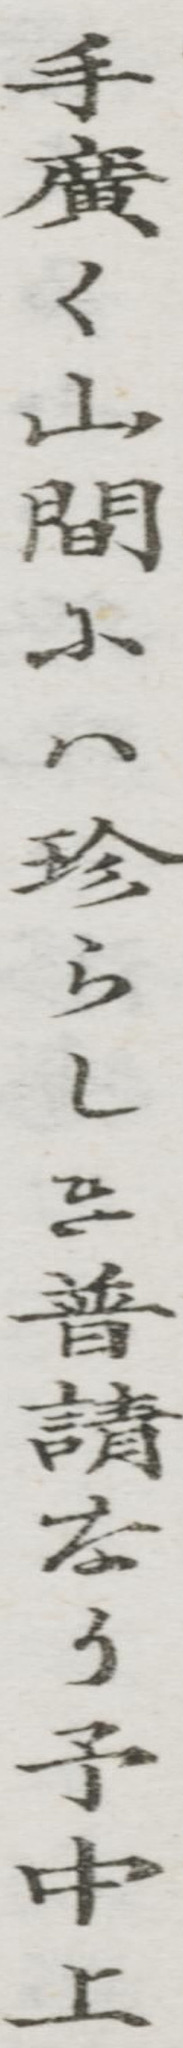手廣く山間には珍らしき普請なり予中上
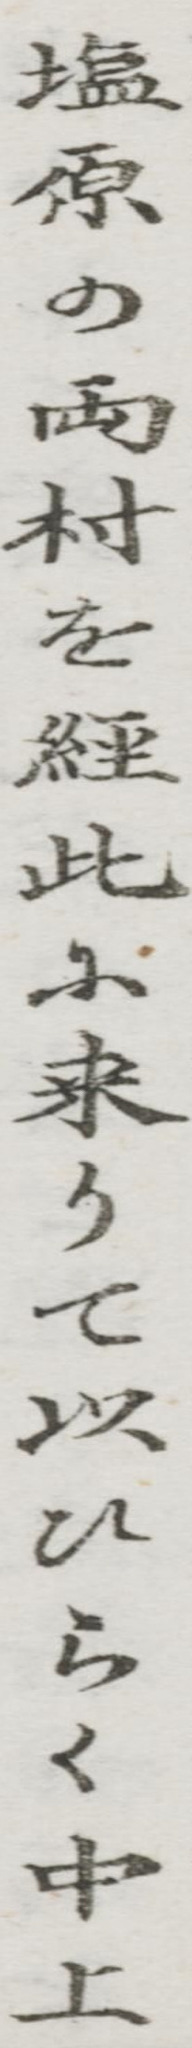塩原の両村を経此に来りて以ひらく中上
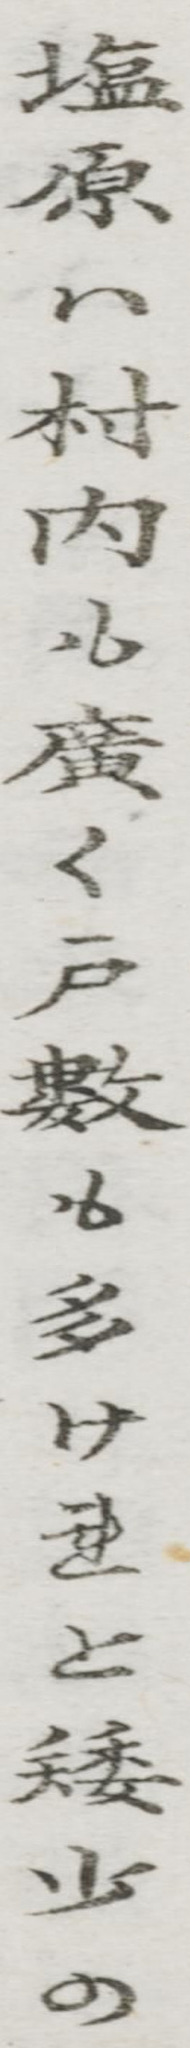塩原は村内も廣く戸数も多けれと矮少の
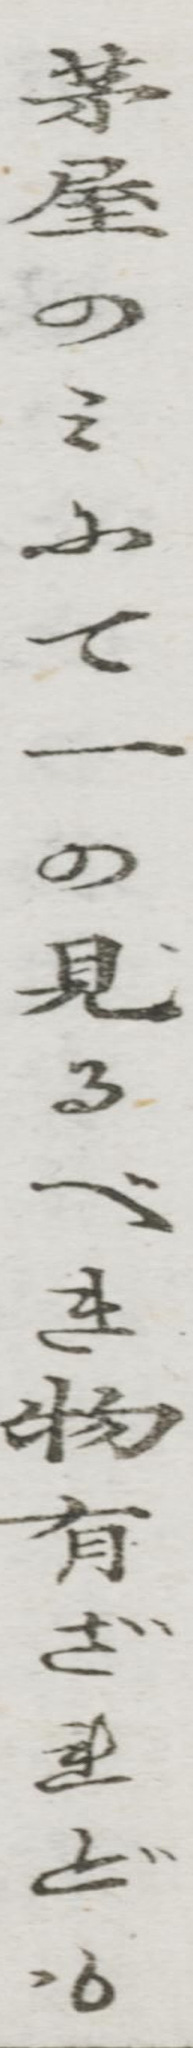茅屋のみにて一の見るべき物有ざれども
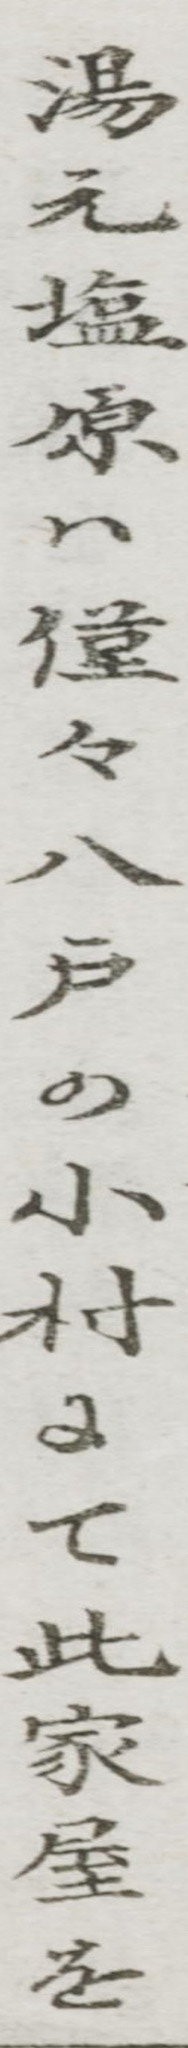湯元塩原は僅々八戸の小村にて此家屋を
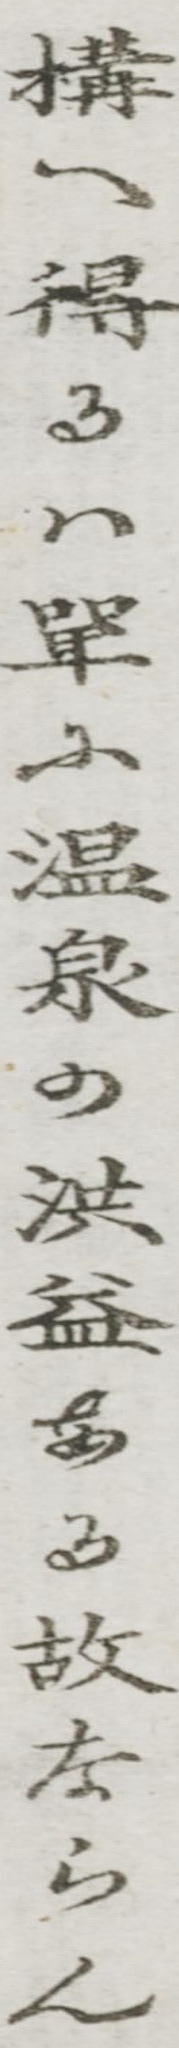構へ得るは単に温泉の洪益ある故ならん
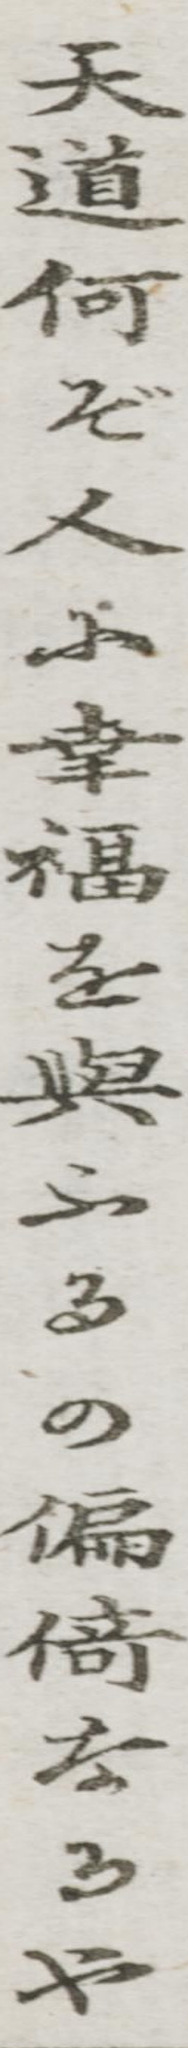天道何ぞ人に幸福を與ふるの偏倚なるや

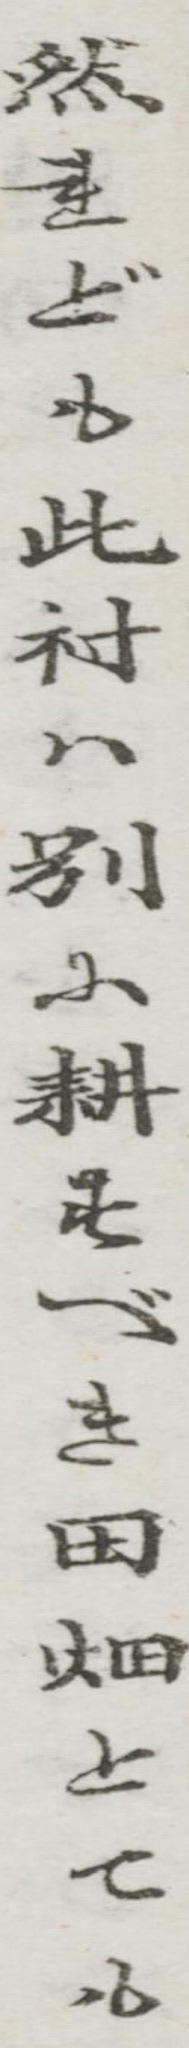然れども此村は別に耕すべき田畑とても
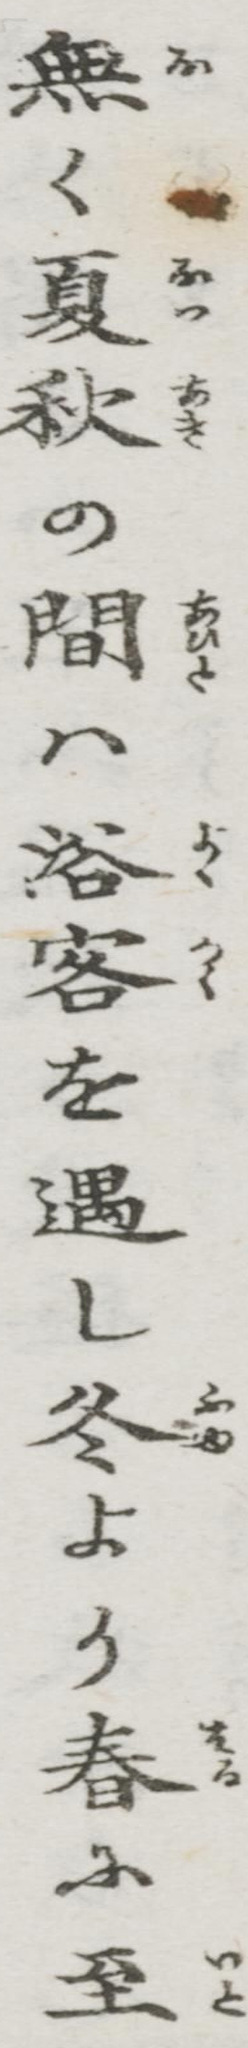無く夏秋の間は浴客を遇し冬より春に至
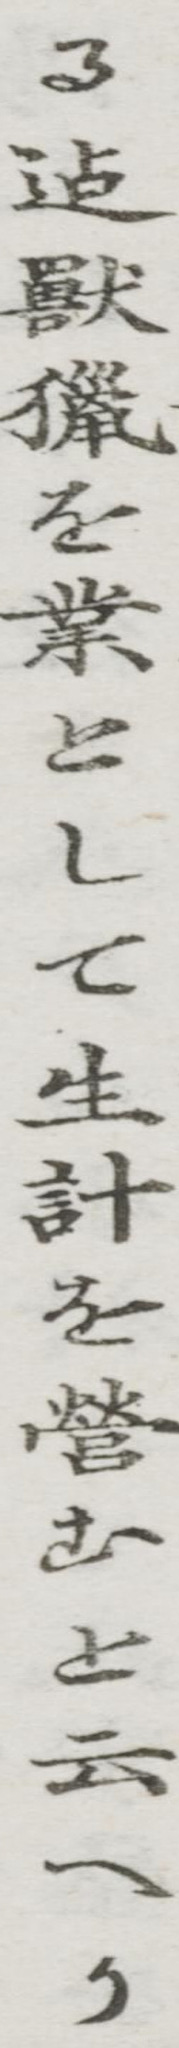る迠獣猟を業として生計を營むと云へり
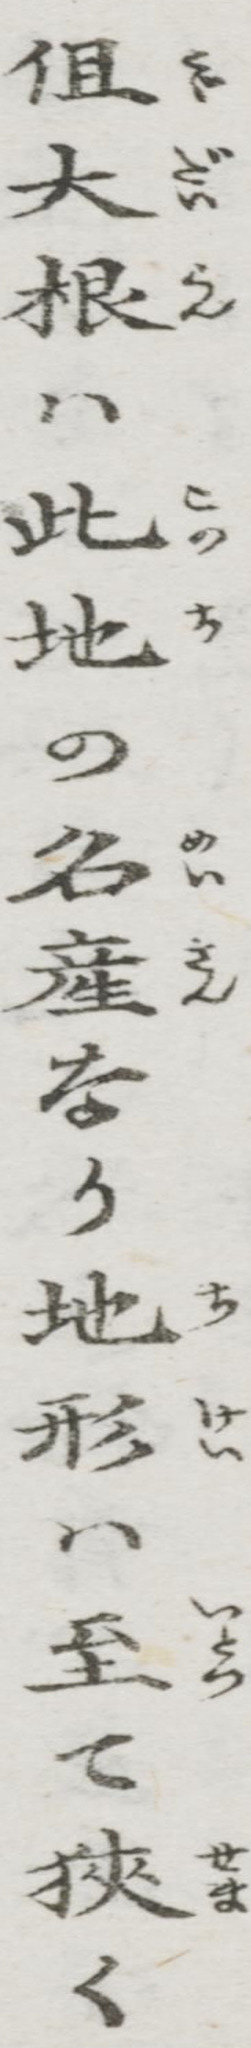但大根は此地の名産なり地形は至て狭く
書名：塩原繁昌記　全
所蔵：東京大学地震研究所図書室 Earthquake Research Institute Library, The University of Tokyo, JAPAN
